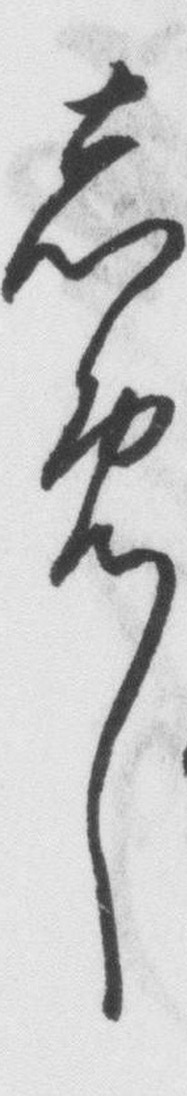しめし
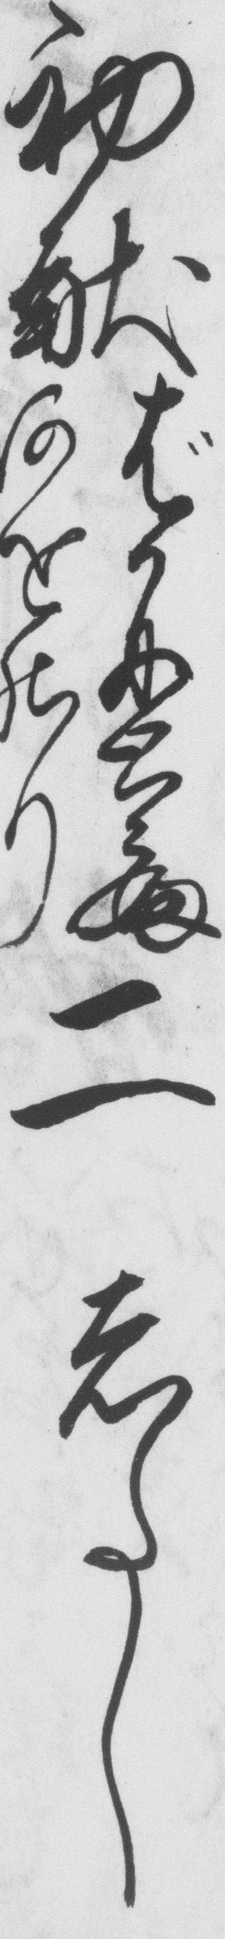初献ばにとうふ二したし
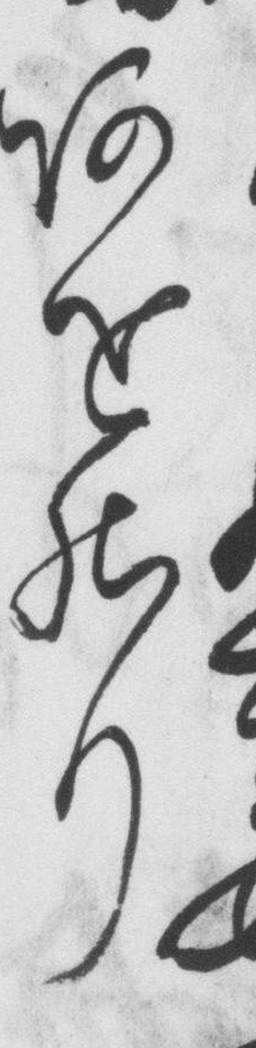あをのり
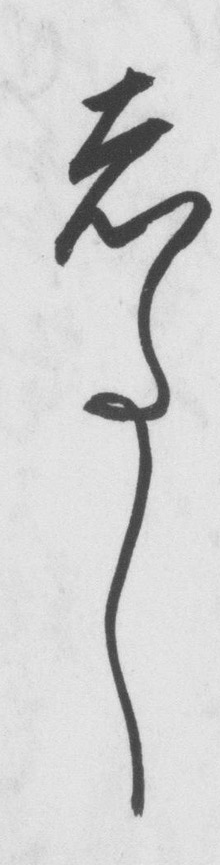しめし

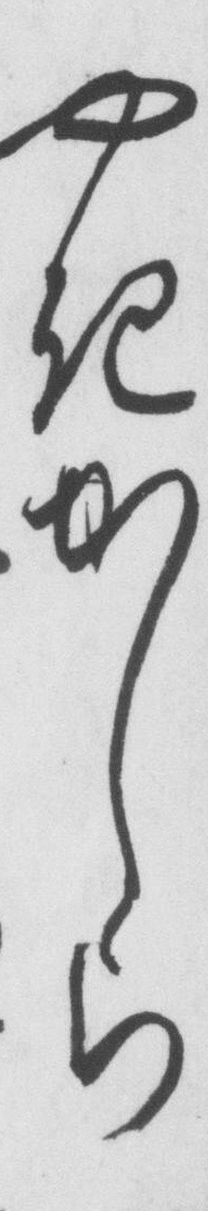やきかしら
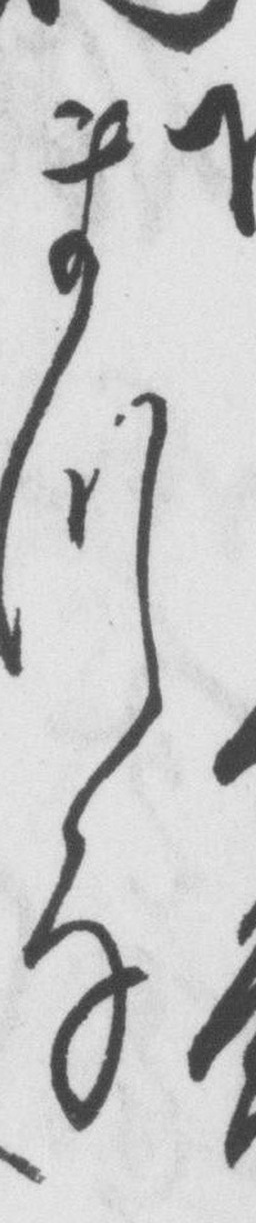まつ茸
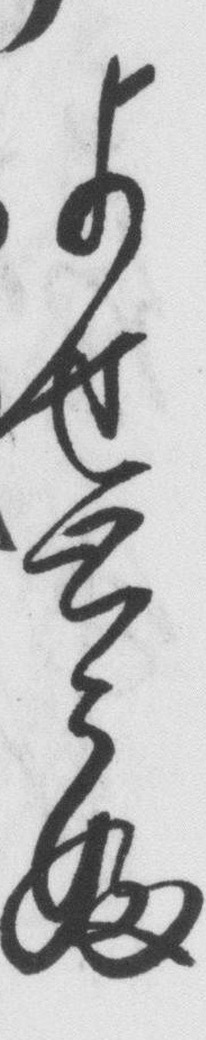よせとうふ
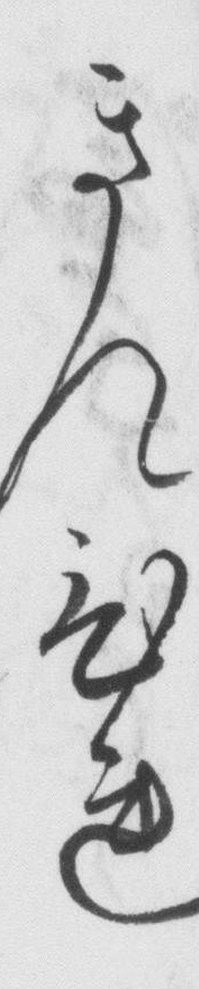きんひれ
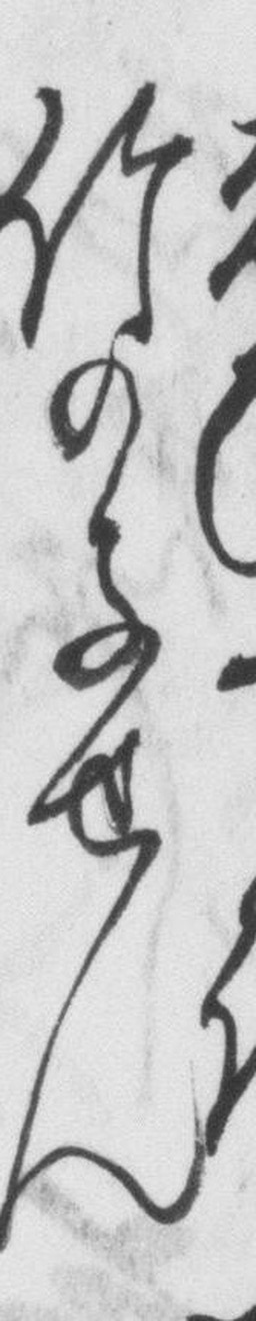竹の子せん
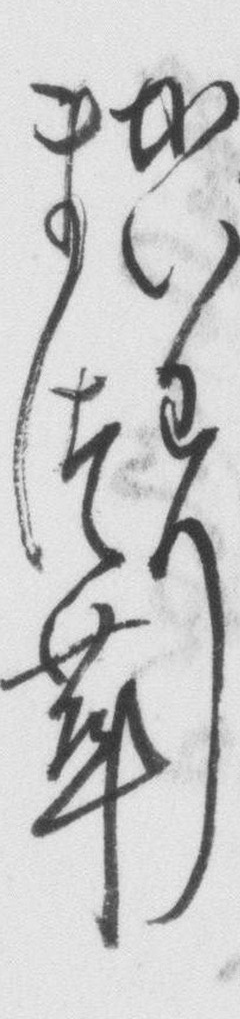まつ茸
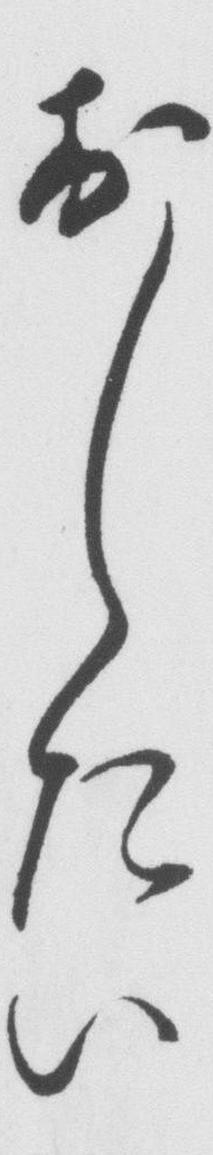おしたい
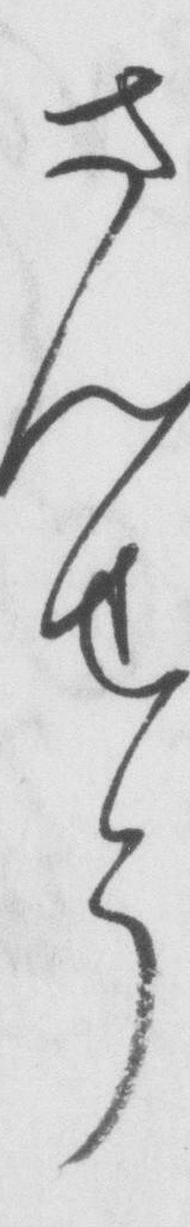さんせう

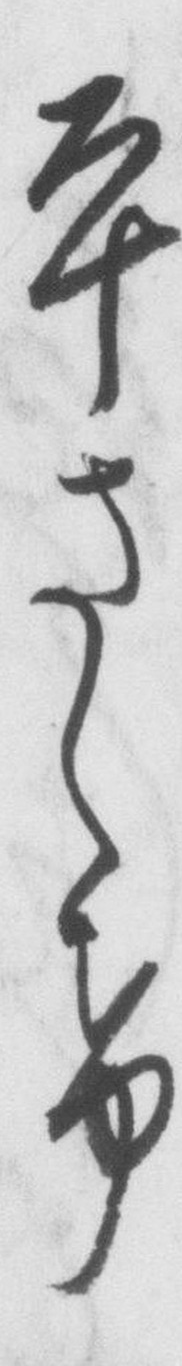平さゝけ
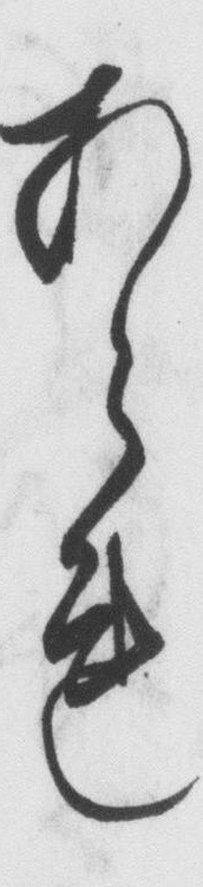あられ

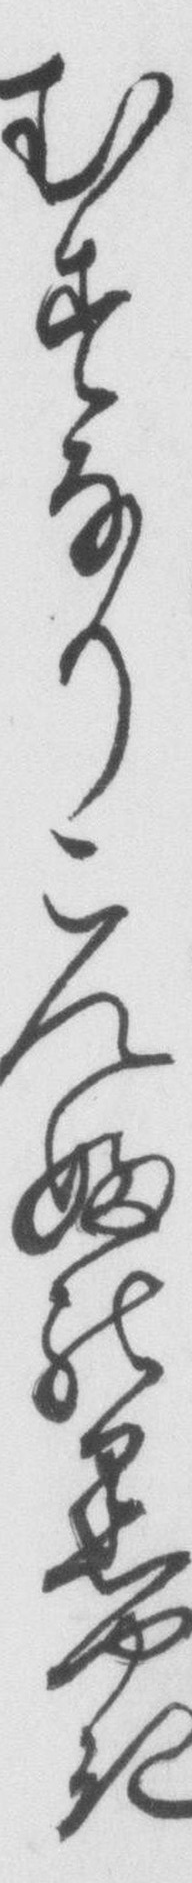むすなりこんふのやき
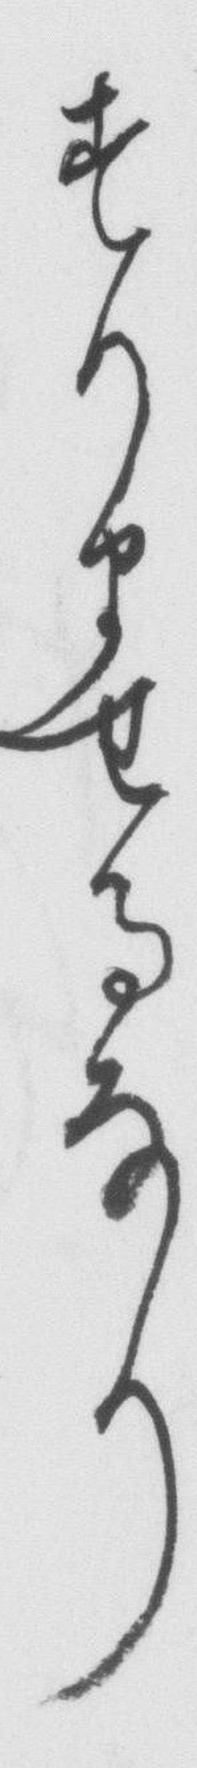すりませるなり
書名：料理筌
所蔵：大阪府立大学学術情報センター 国文学研究資料館
